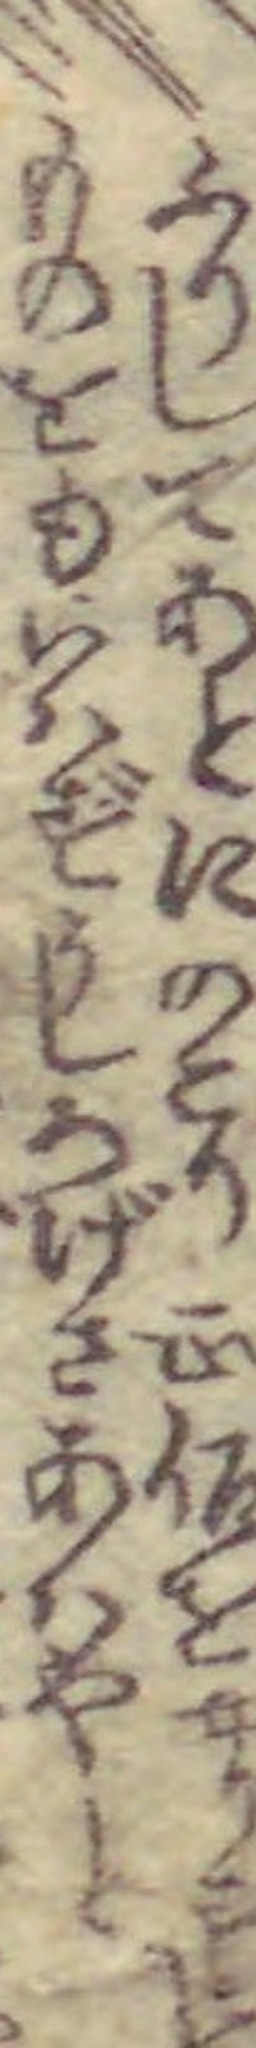ものをもいはずうしろげさあはやと
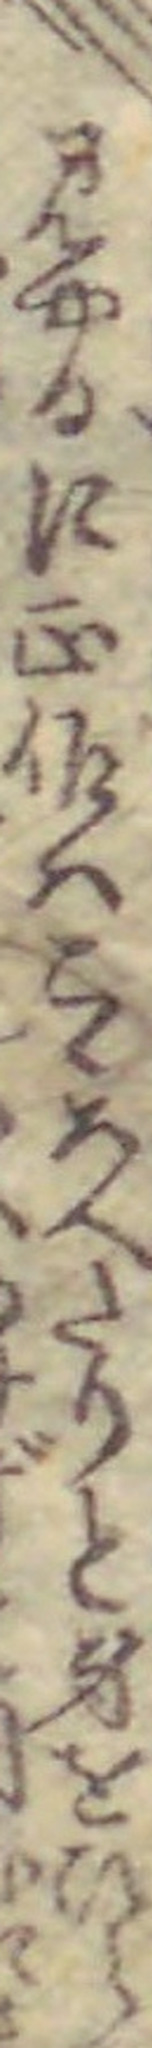見ゆるに正作はこゝろへたりと身をひらき
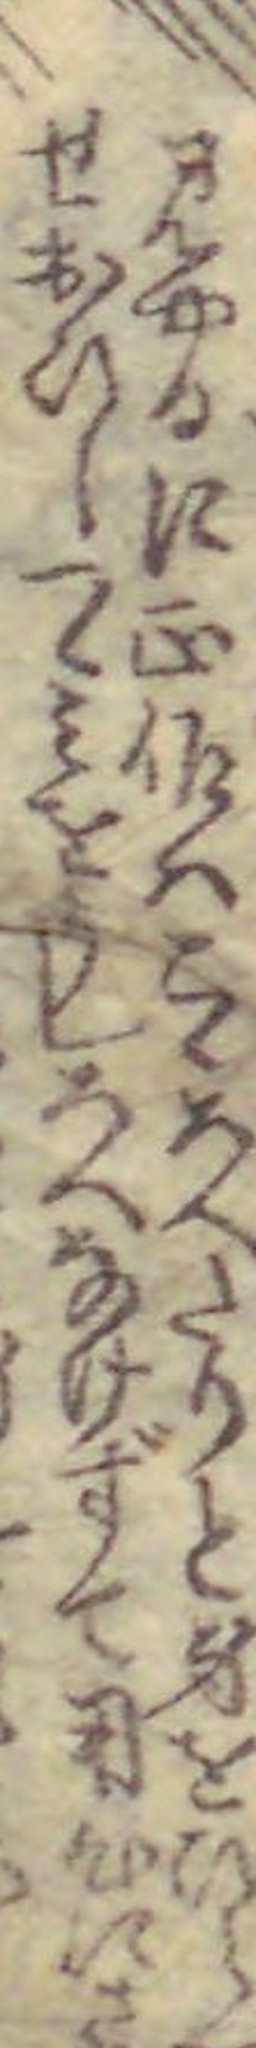せおひしつゝみをうしろへなげすて用心にさす
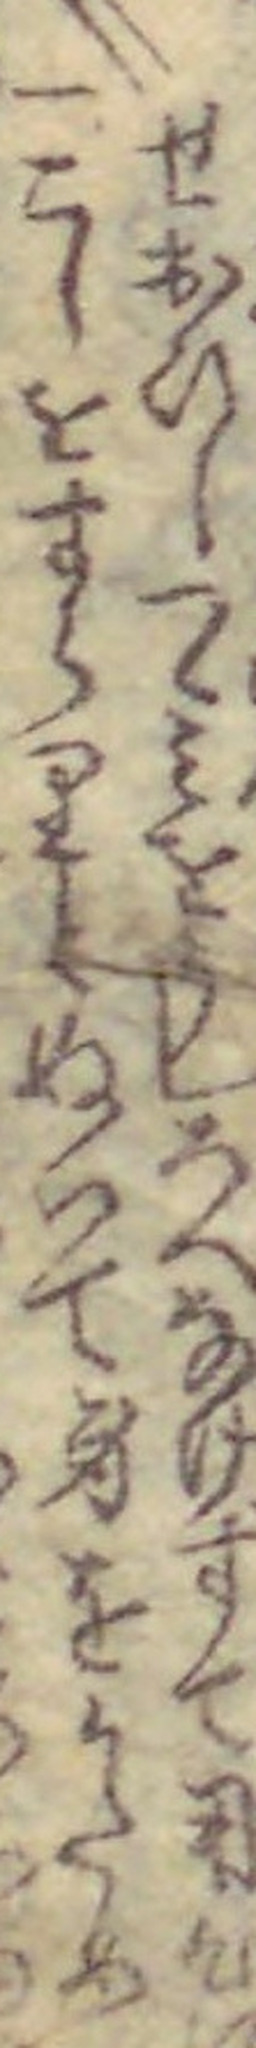一こしをすらりとぬいて身をかため
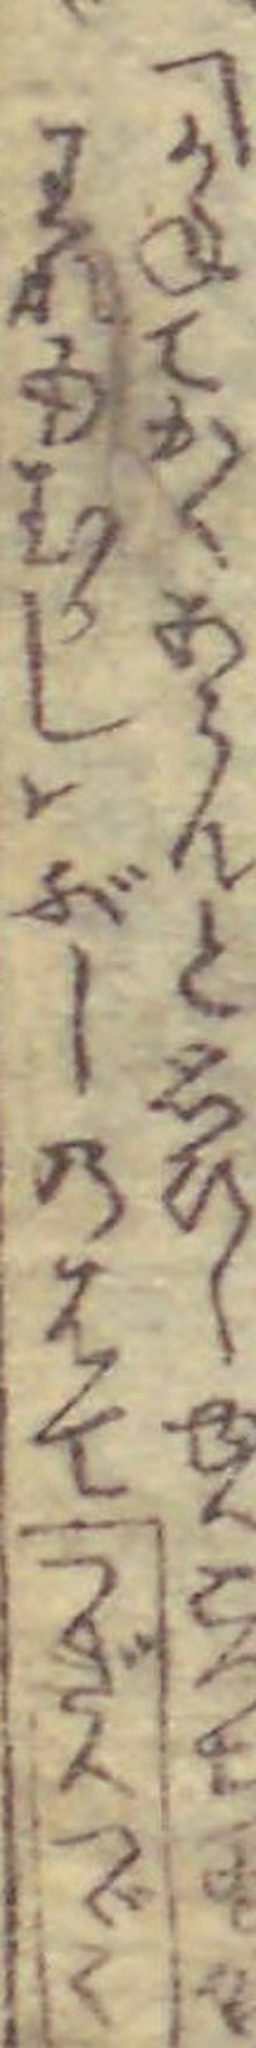われもむかしはぶしのはて「つぎへつゞく」

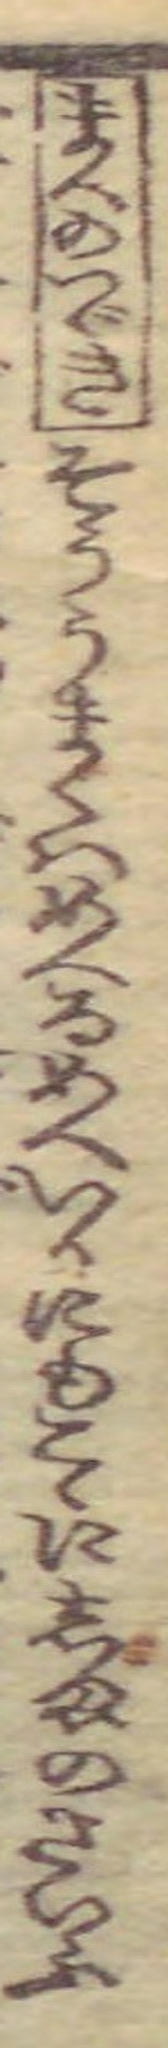「まへのつゞき」そううまくはめへるめへいかにもこゝにしまのさいふ
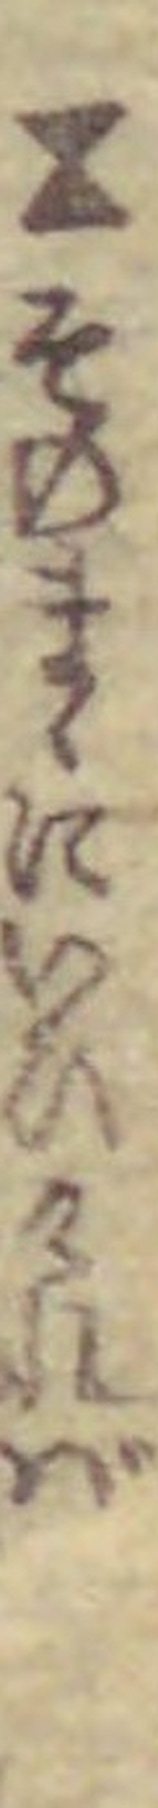▼▲そのまゝにいひければ
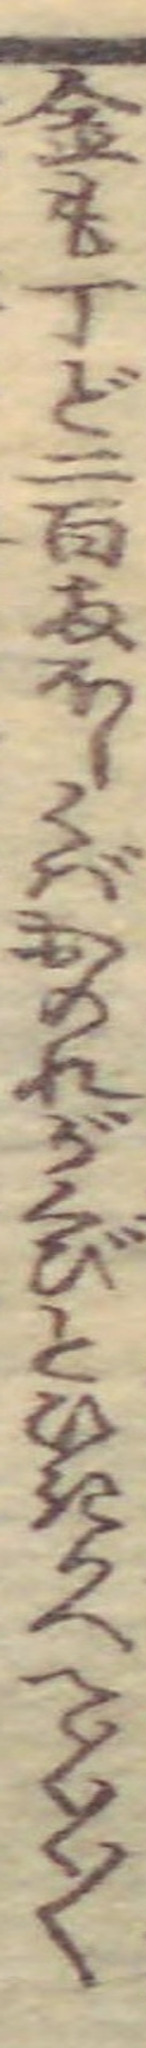金も丁ど二百両ほしくばおのれがくびとひきかへへい〳〵〳〵〳〵
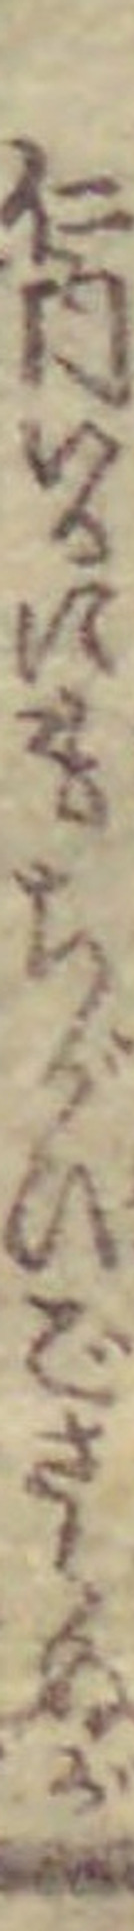仁内いかにもちがひごさらぬが
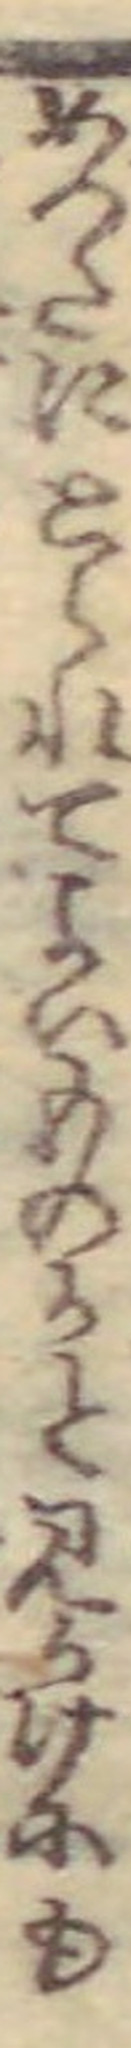めつたにとられてよいものかと見かけにも
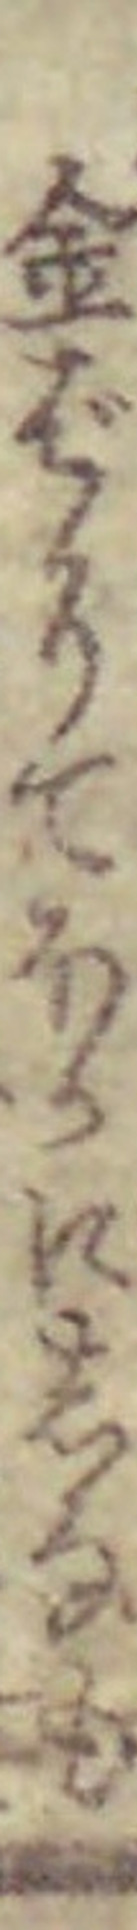金ばかりてほかにしなも
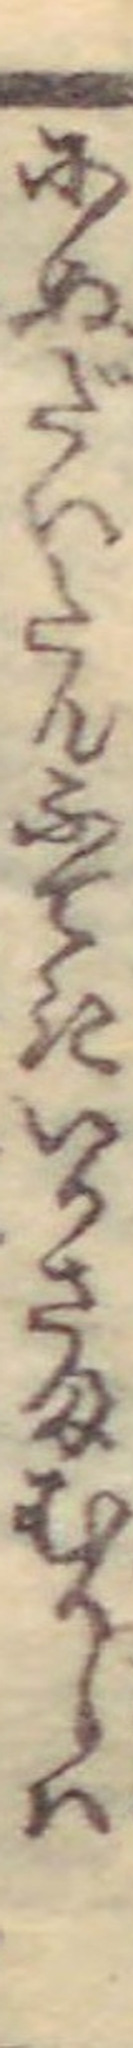にぬだいたんふてきいかさまむかしは
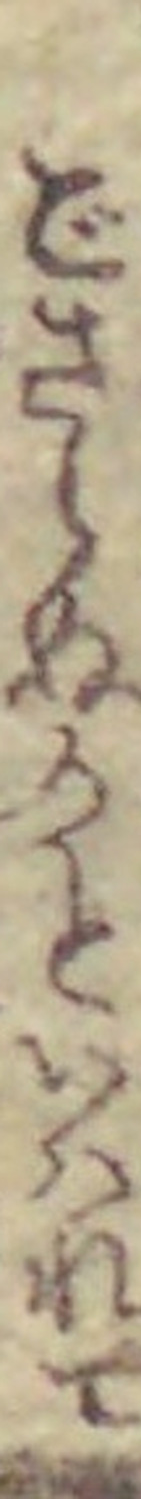ごさらぬかといはれて
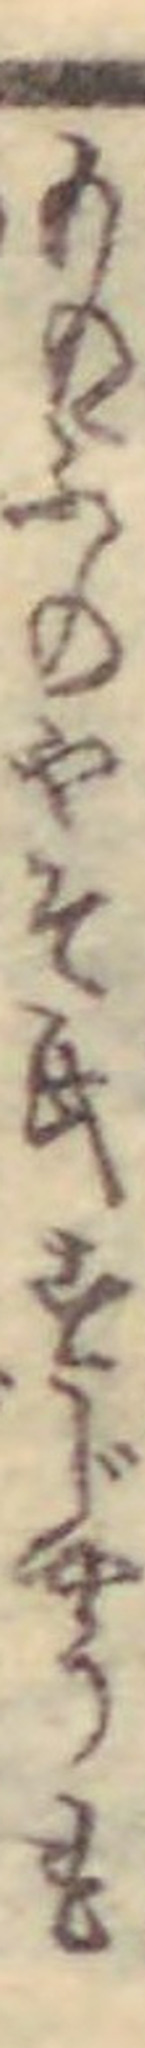ものゝふのやそ氏すじやうも
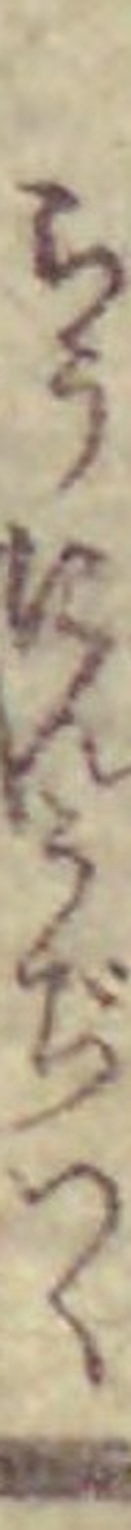らうにんうぢつく
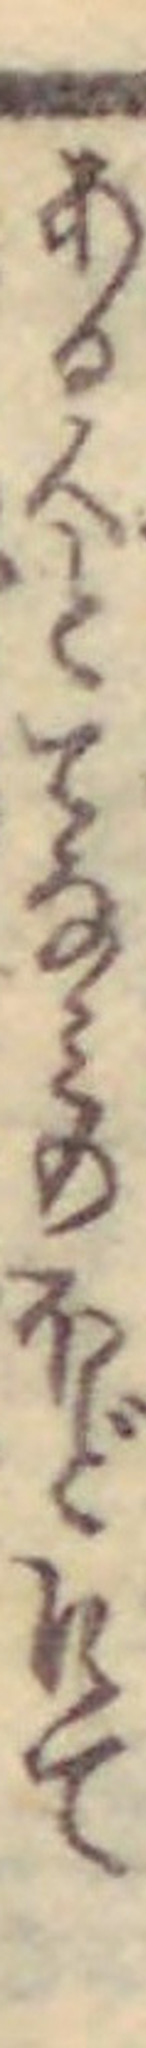ある人とてなみのほどにて
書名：八ツ目鱣因縁物語 3巻
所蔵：国立国会図書館 National Diet Library, JAPAN
